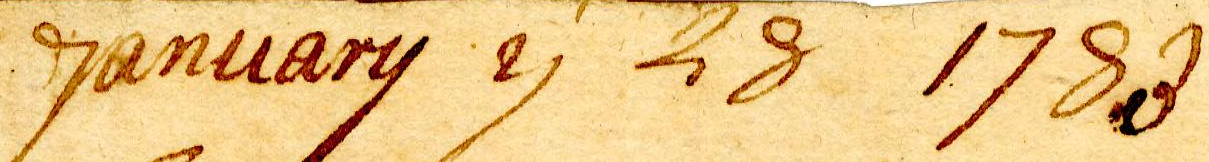January 28 1783
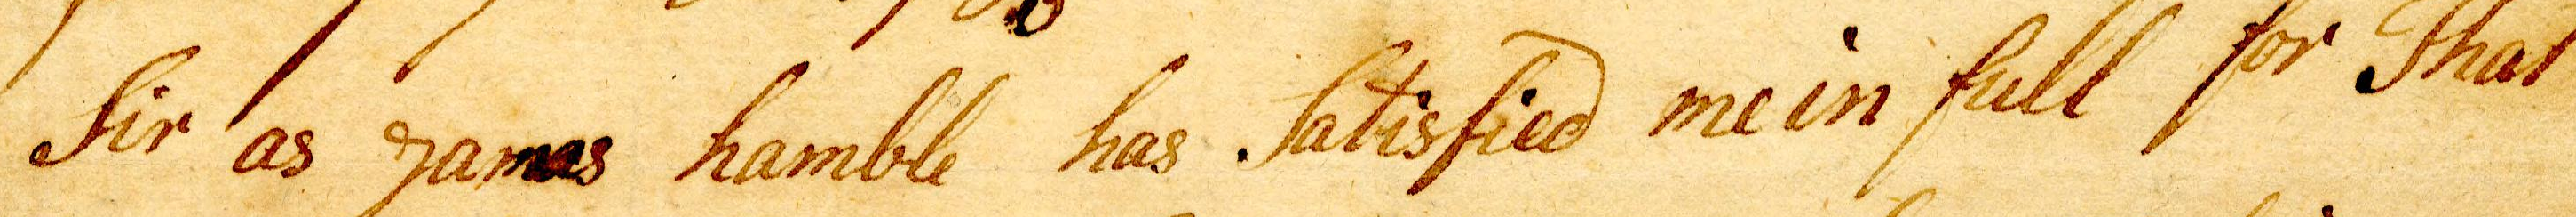Sir as James hamble has Satisfied me in full for That
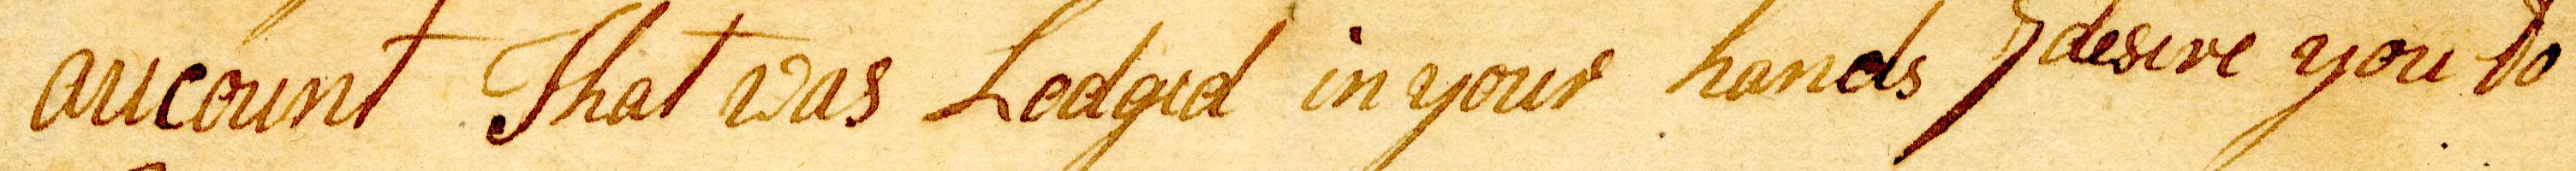Account That Was Ledged in your hands I desire you to
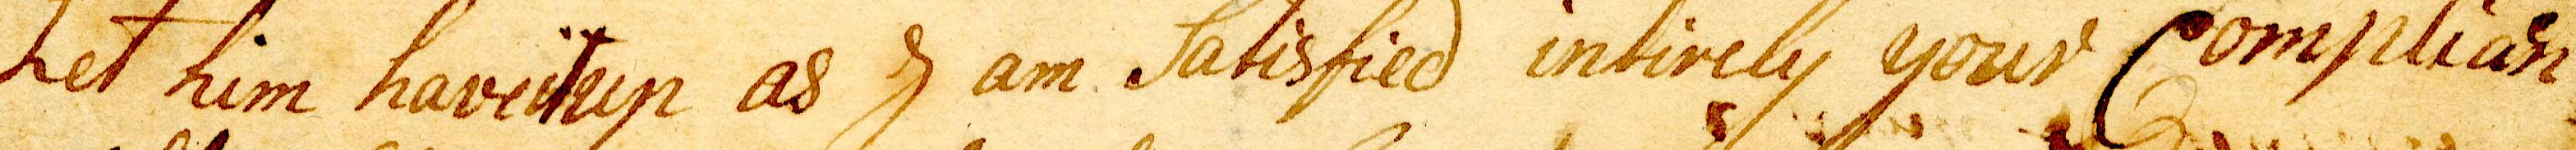Let him have it up as I am satisfied intirely your Complian^e
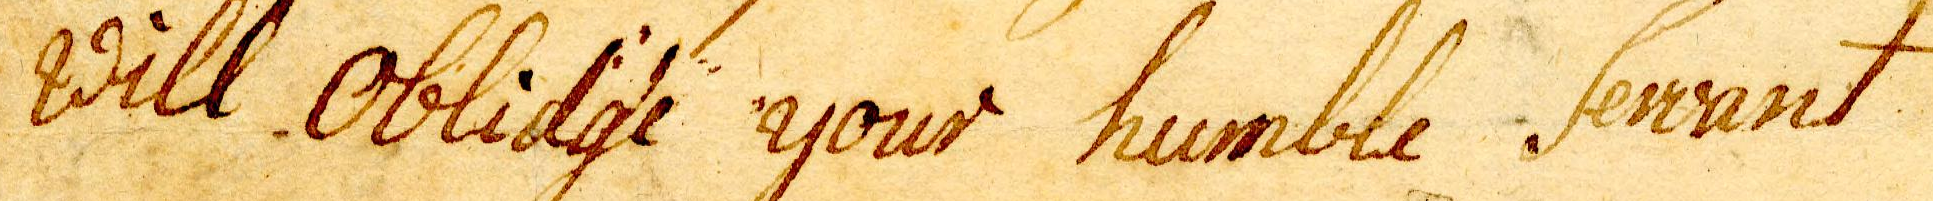will Oblidge your humble Servant
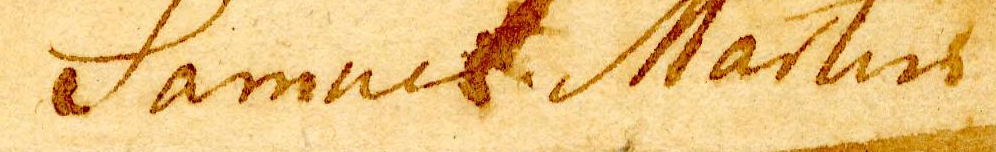Samuel Martin
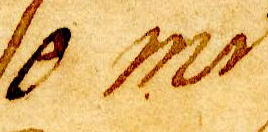To M^r
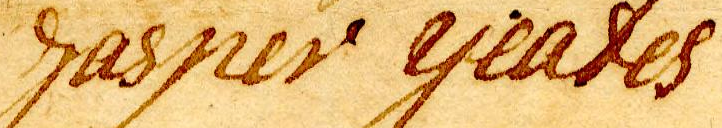Jasper Yeates
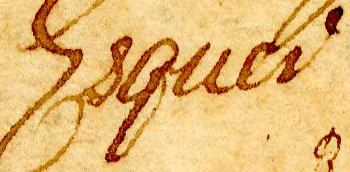Esquir^e
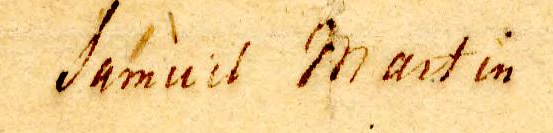Samuel Mart in
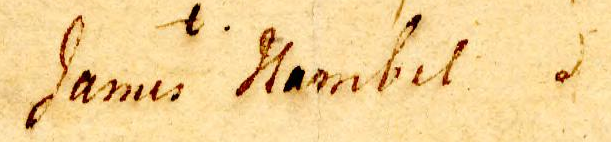James Hambel
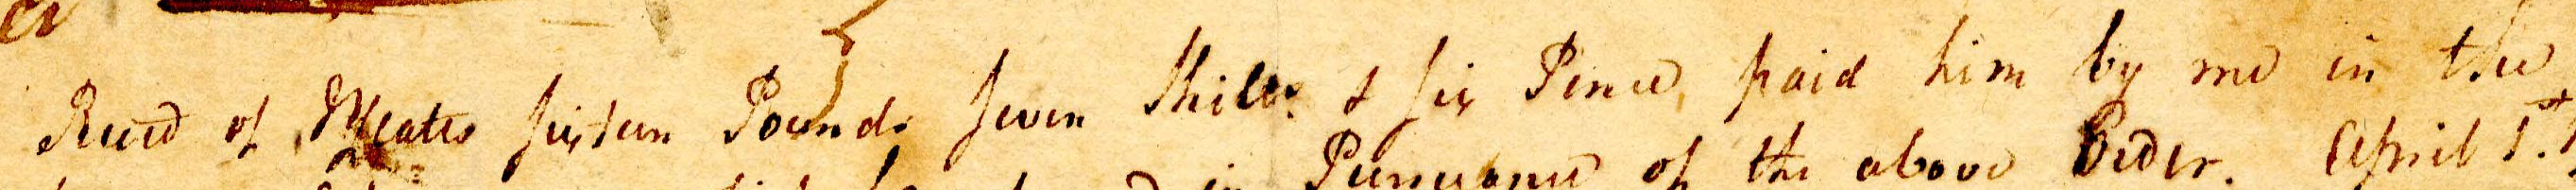Reced of J Yeates Sixteen Pounds Seven Shills. & Six Pence paid him by me in the
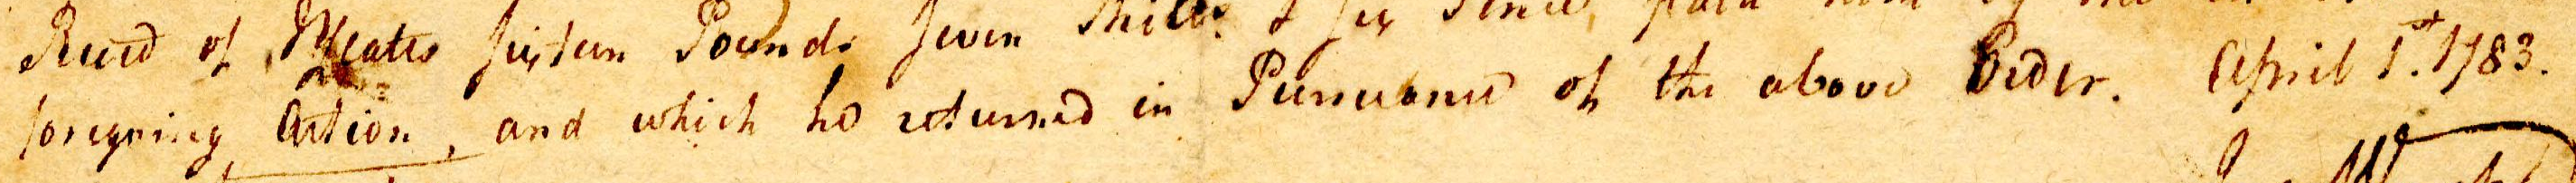foregoing Action, and which he returned in Purchase of the above Order. April 1^st. 1783.
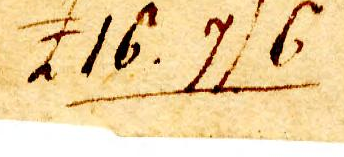£16. 7/6
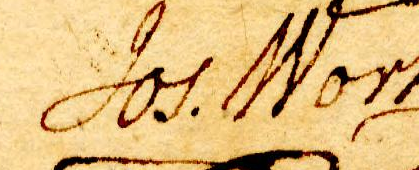Jos. Work
